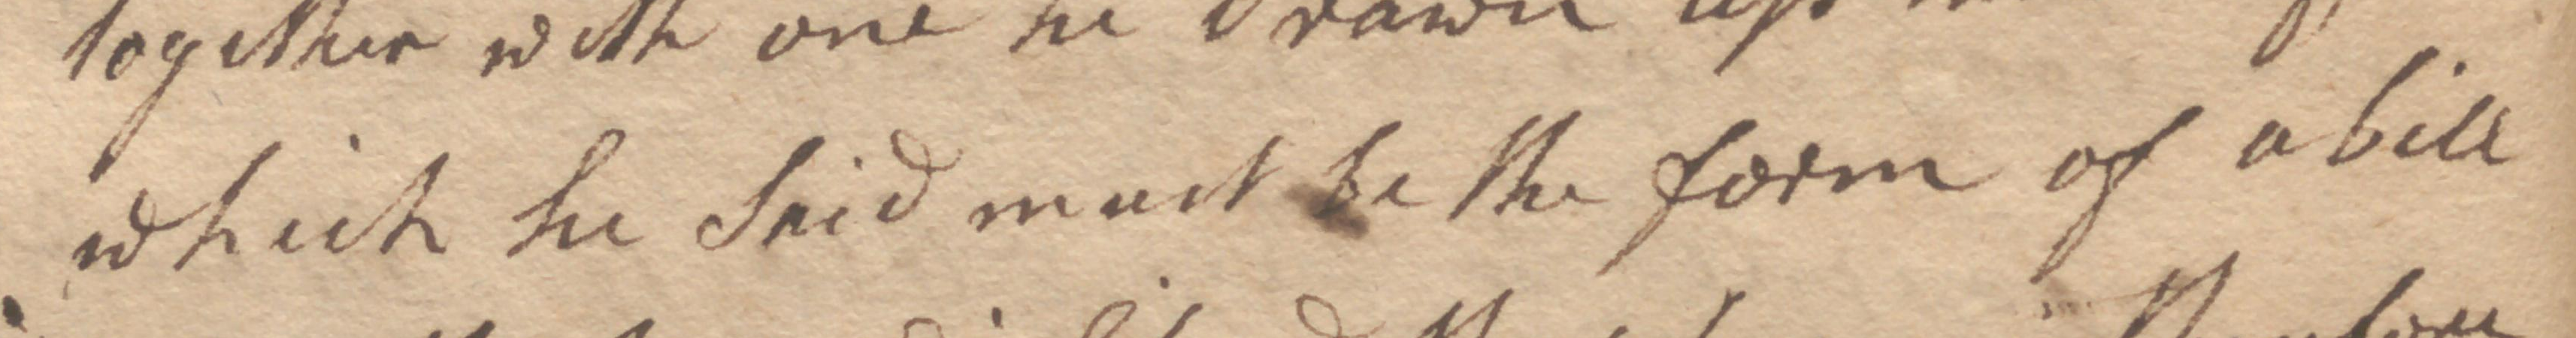which he said must be the form of a bill
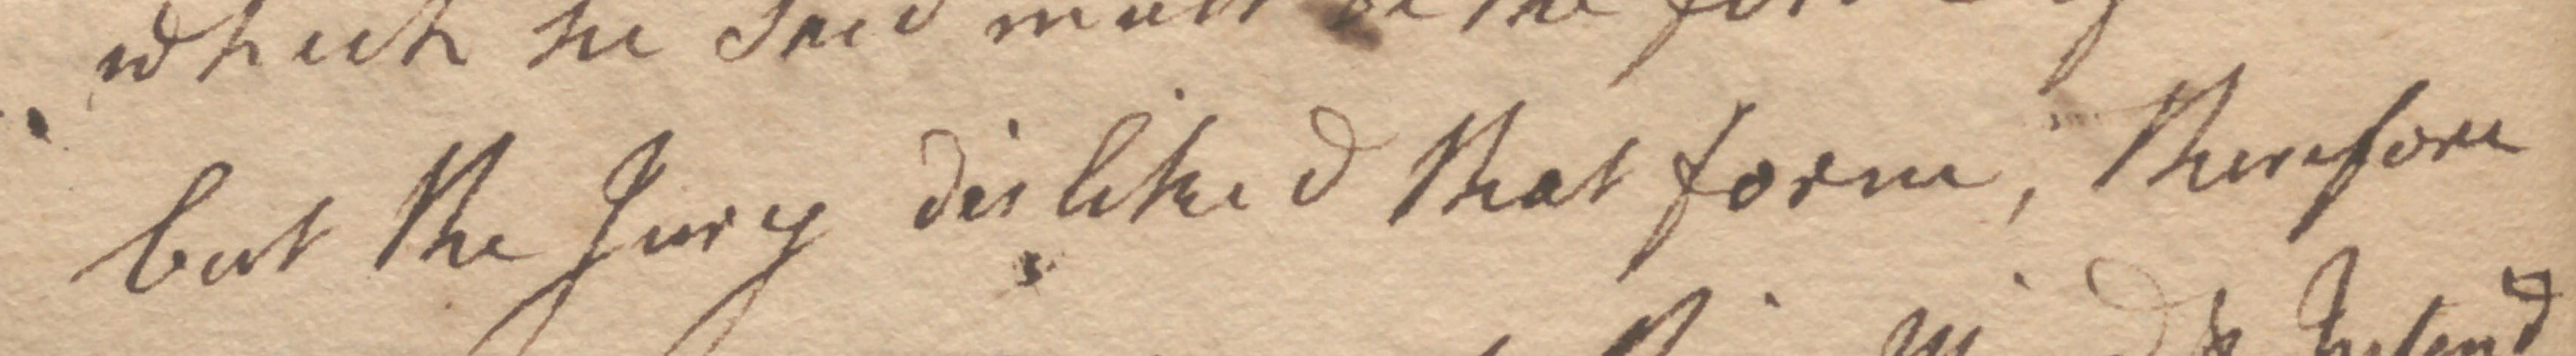but the Jury disliked that form, therefore
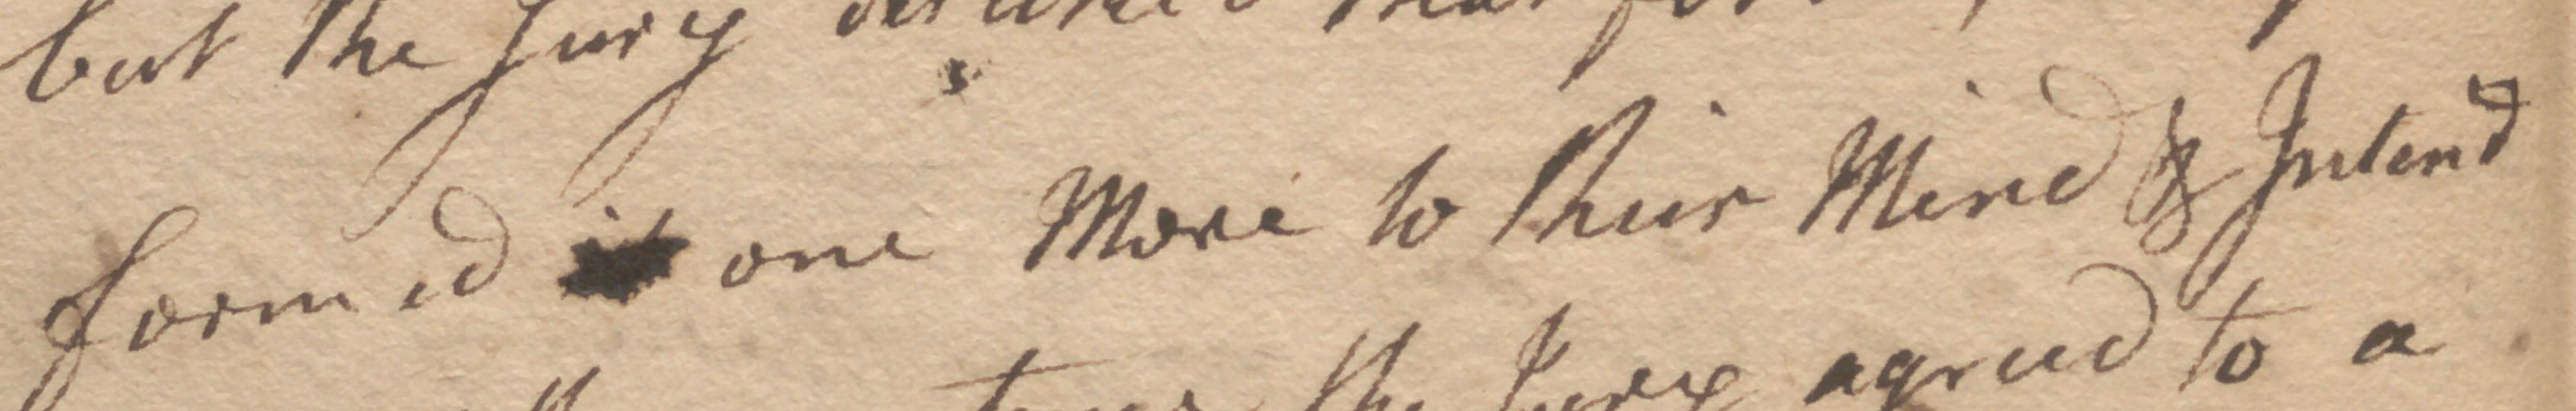formed [it] one More to their Mind & Intend
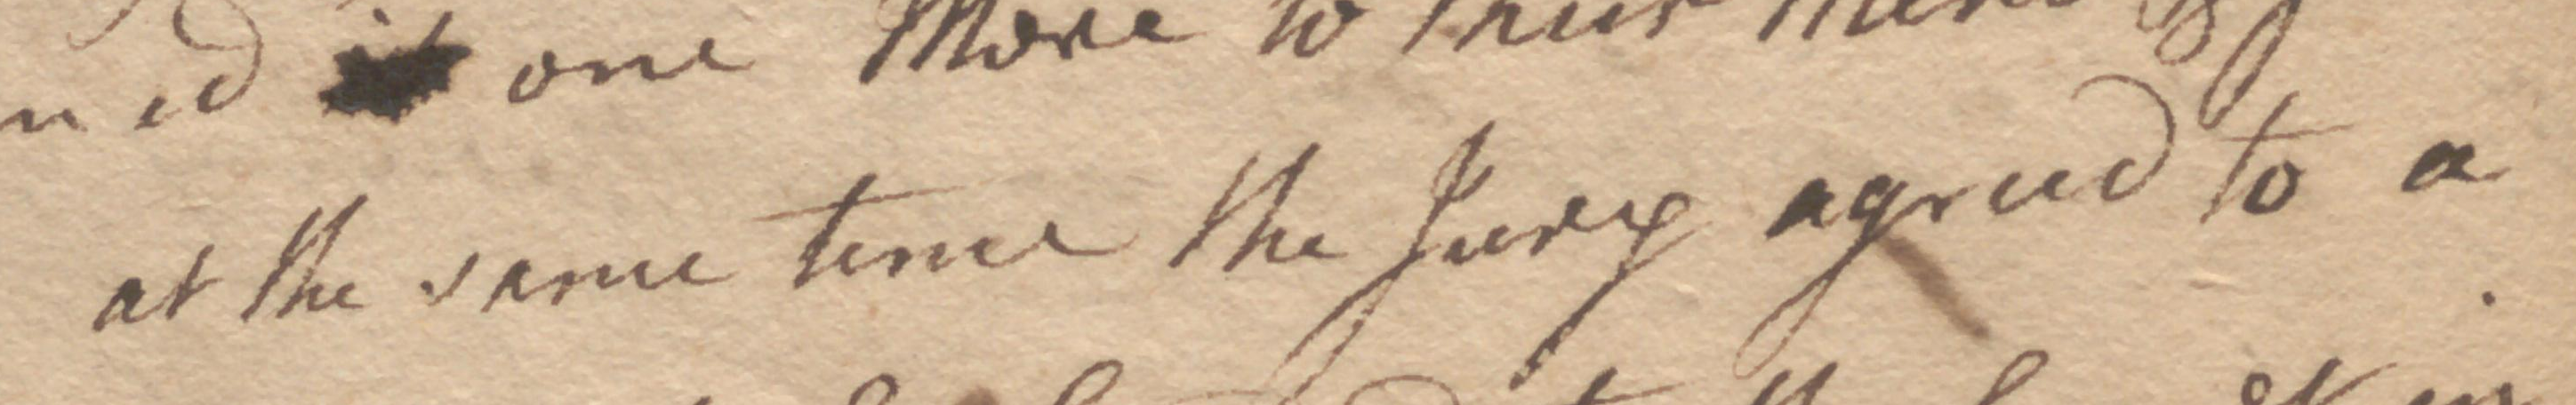at the same time the Jury agreed to a
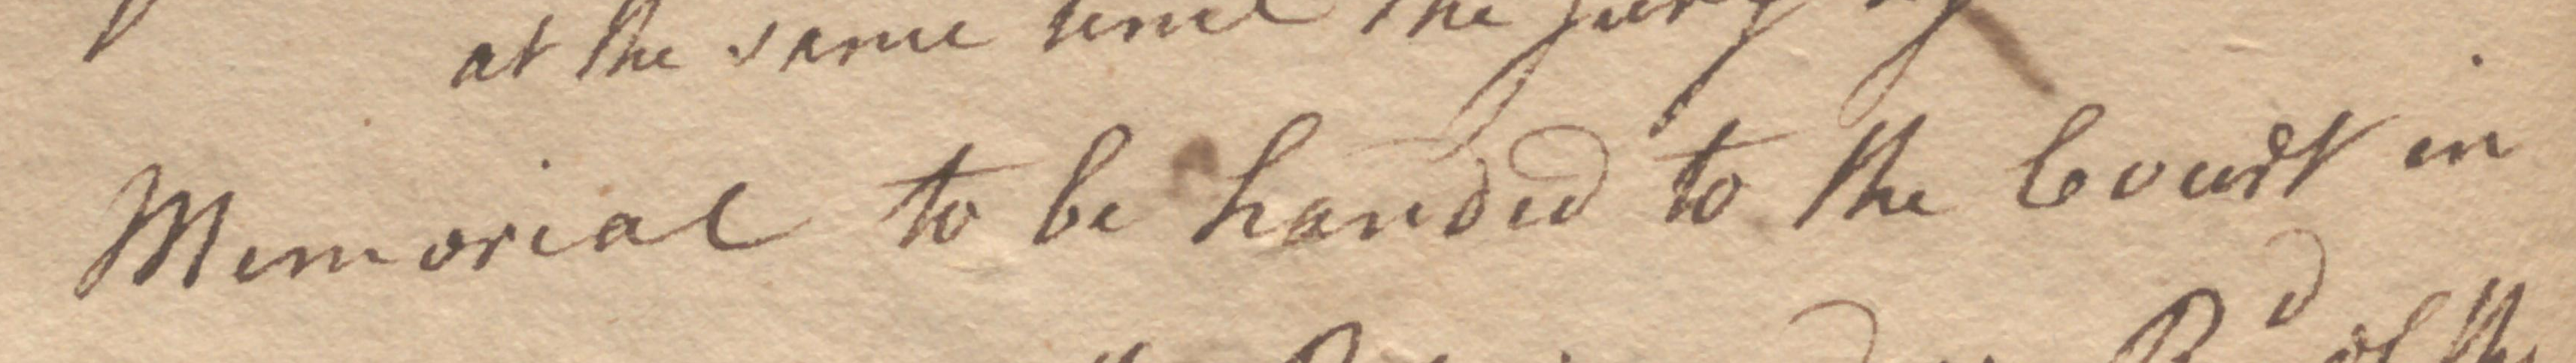Memorial to be handed to the Court in
